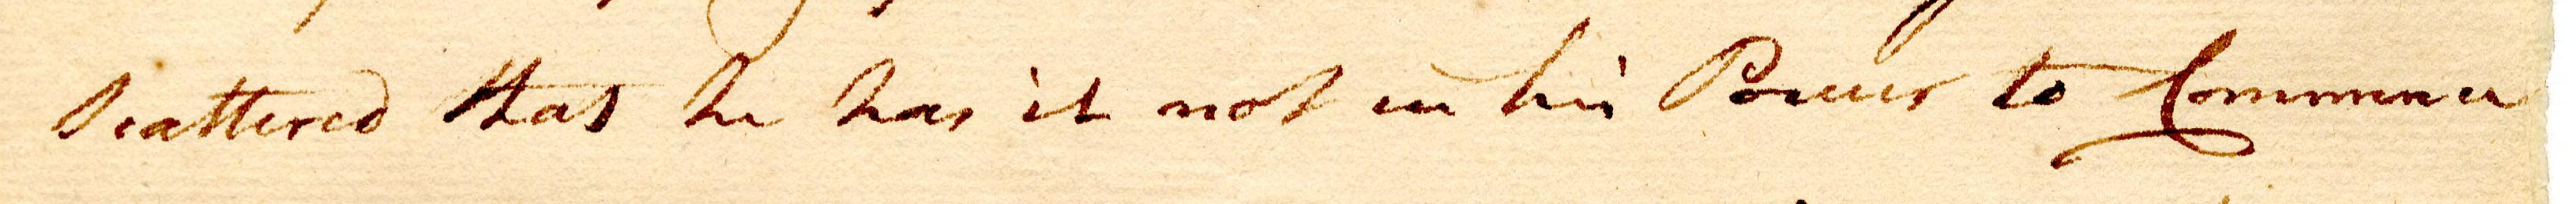Scattered that he has it not in his power to Commence
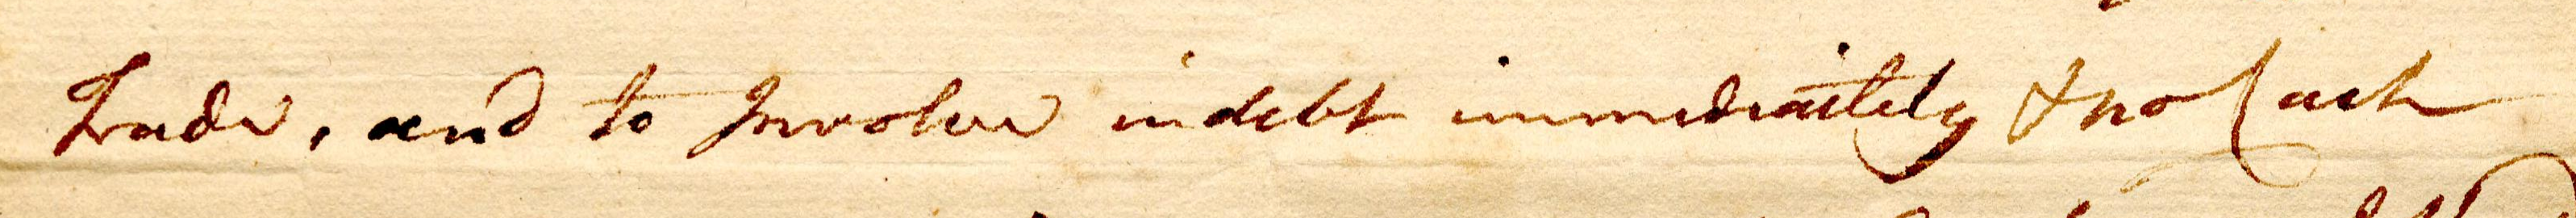Trade, and to Involve in debt immediately & no Cash
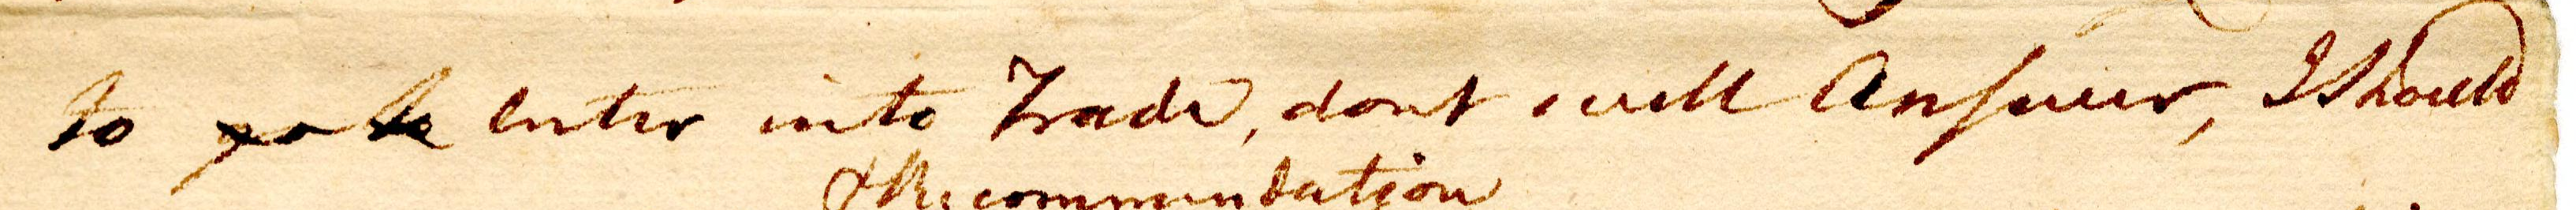to [____] enter into Trade, dont well Answer, I Should
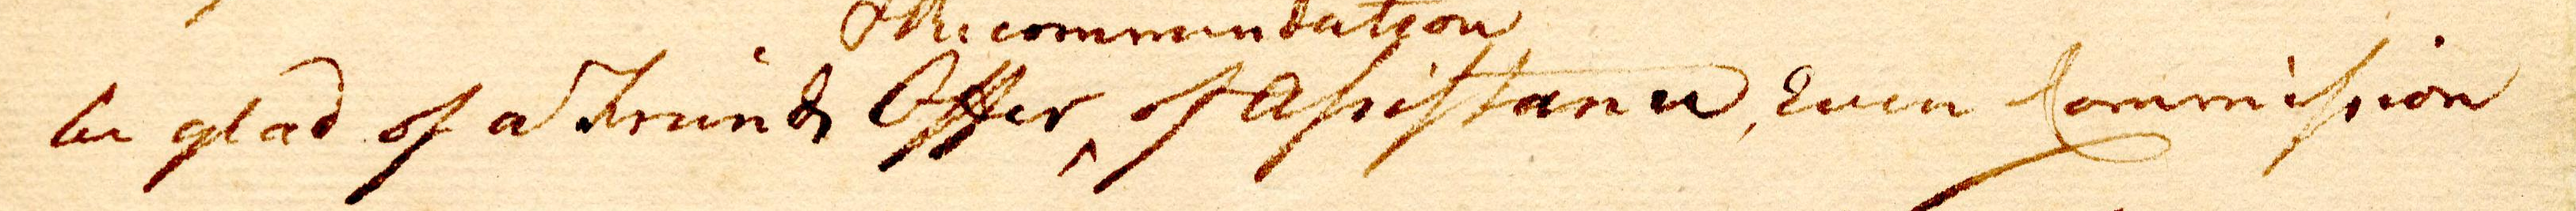be glad of a Friends Offer ^ of Assistance Even Commission
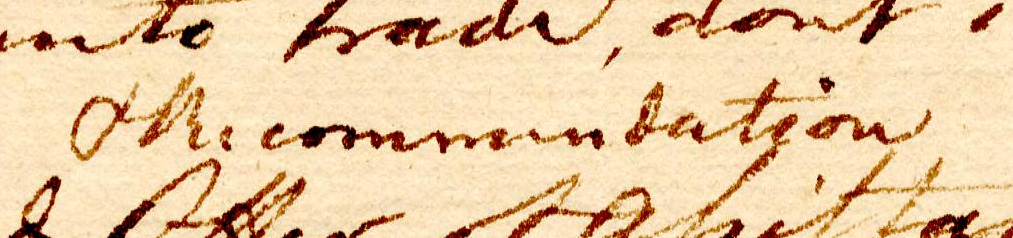& Recommendation
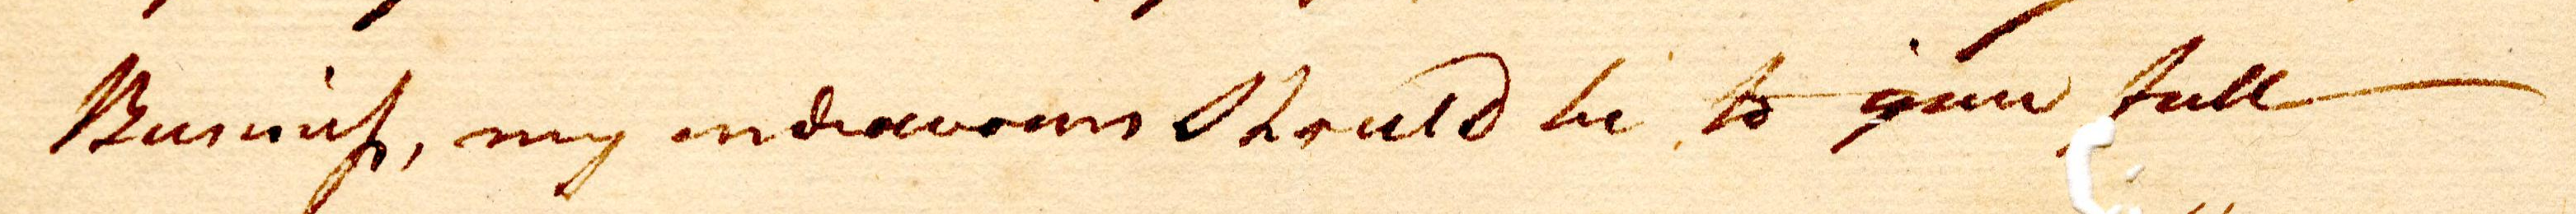Business, my endeavors should be to give full
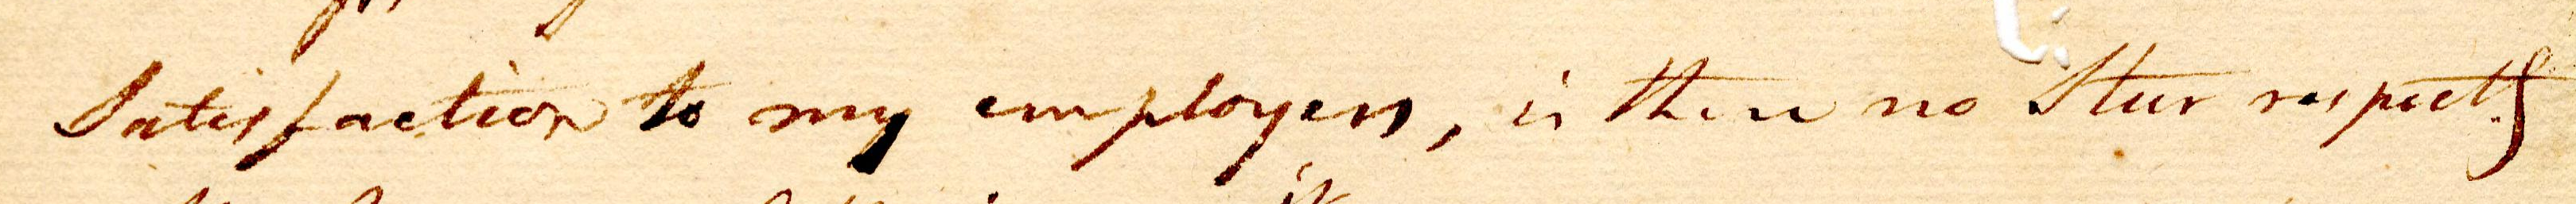Satisfaction to my employers, is there no Steer respect^g
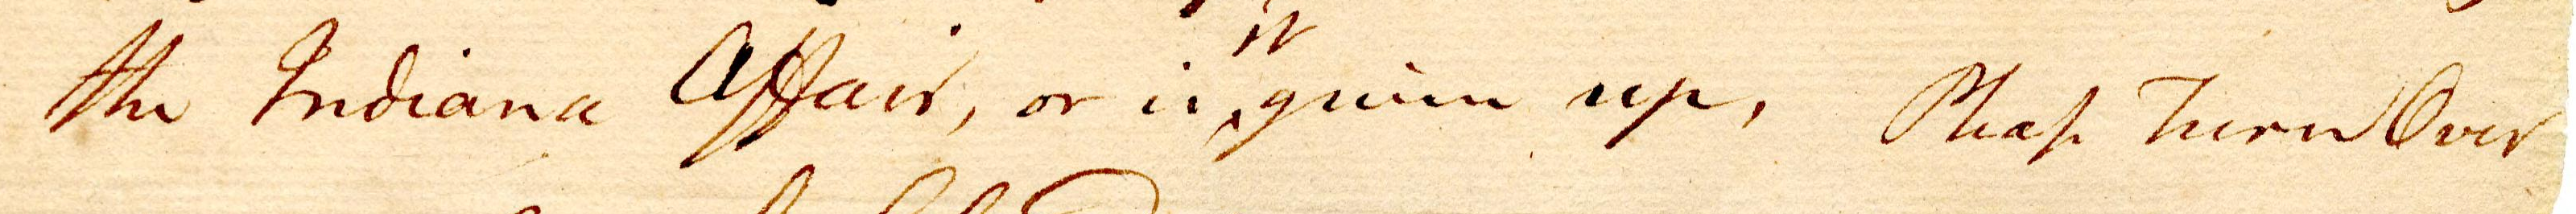the Indiana Affair, or is ^ given up, Please turn Over
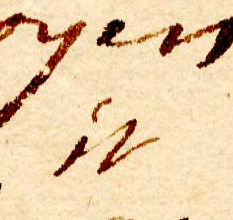it
